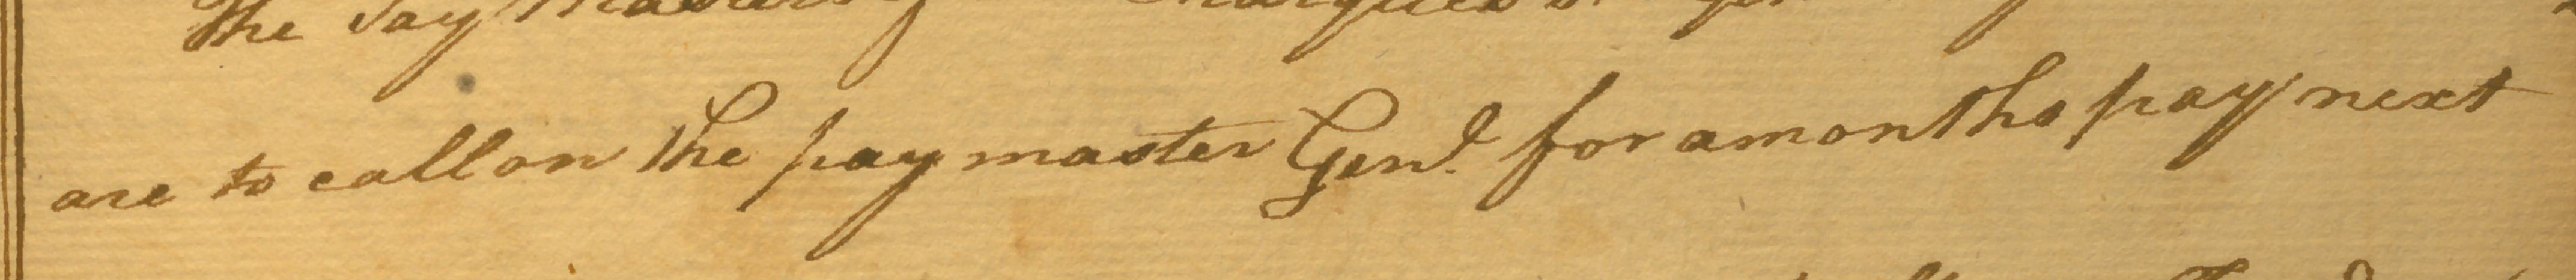are to call on the pay master Gen^l. for a months payment
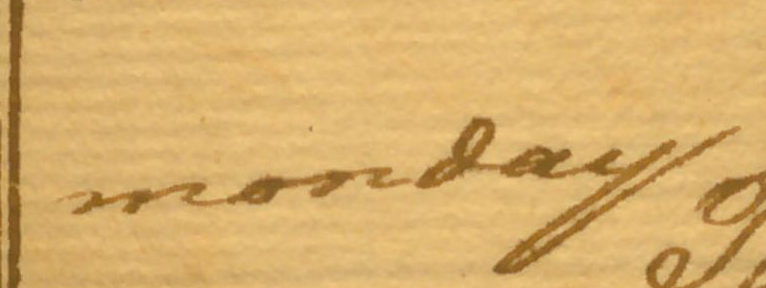monday
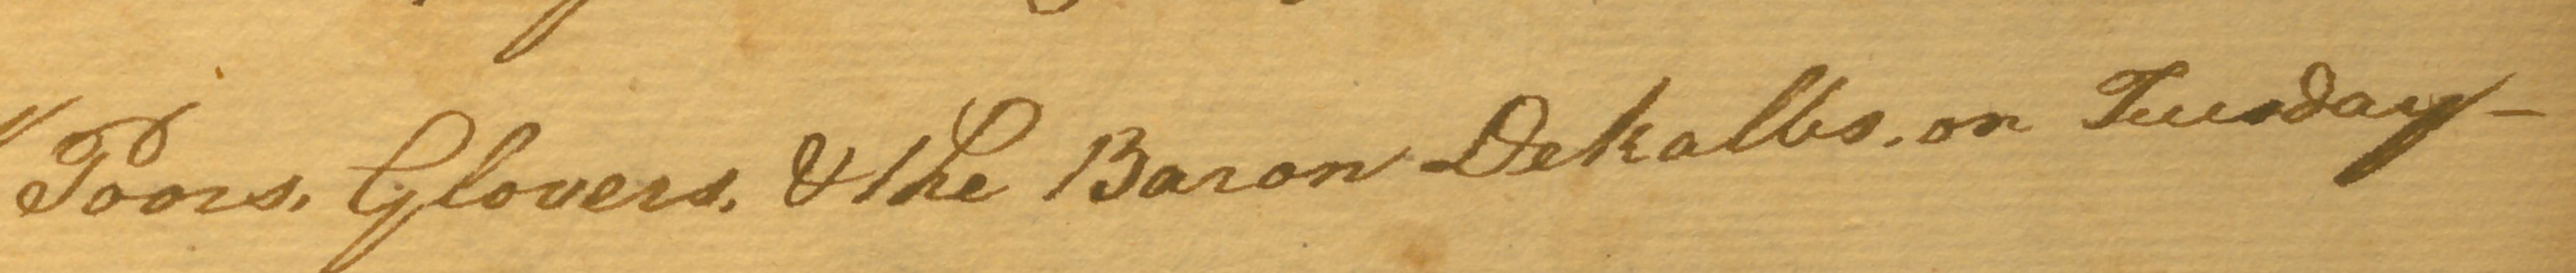Poors, Glovers, & the Baron Dekalbs on Tuesday-
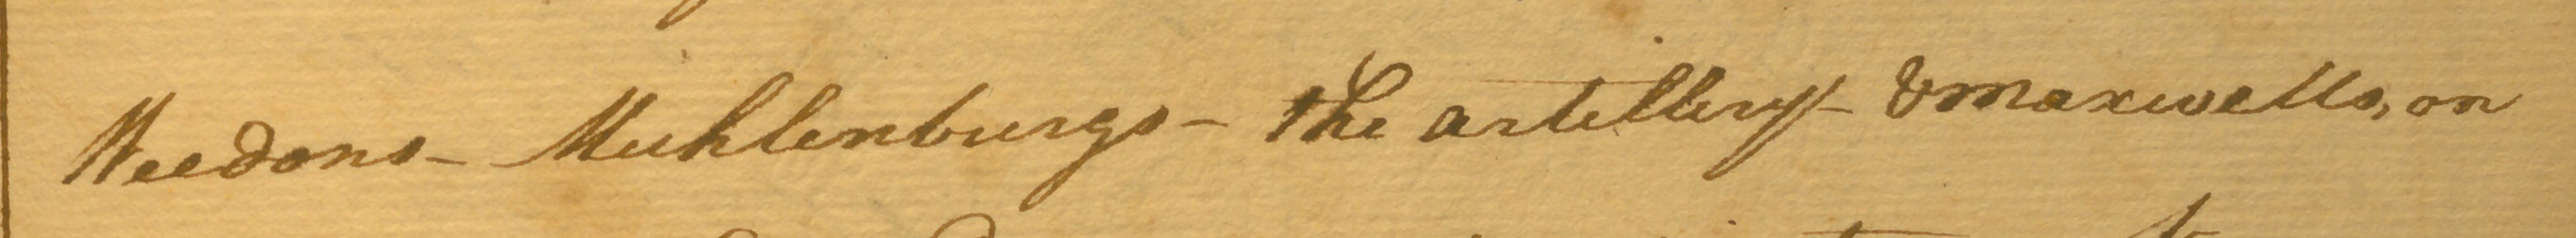Weedons- Muhlenburgs- the artillery & maxwells, on
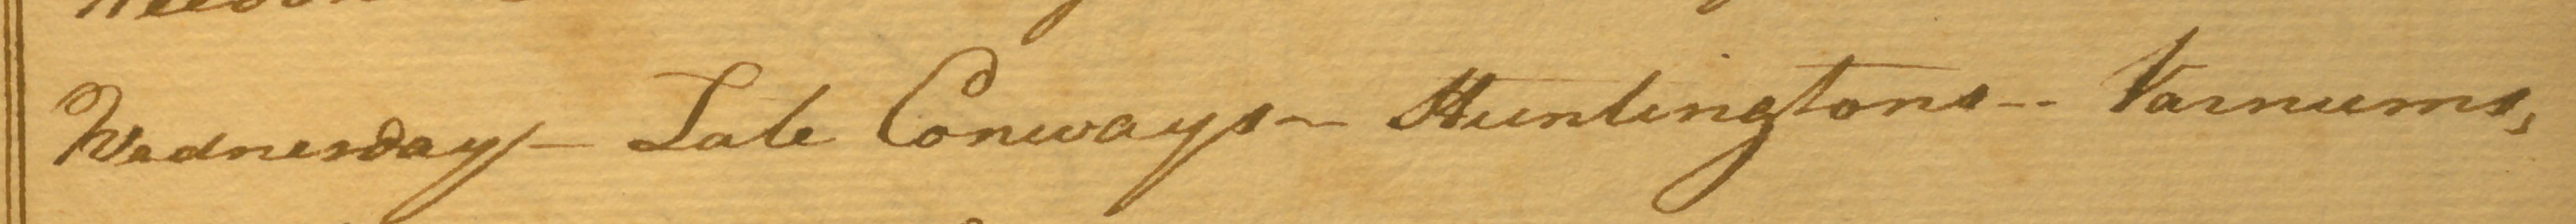Wednesday- Late Conways- Huntingtons- Varnums,
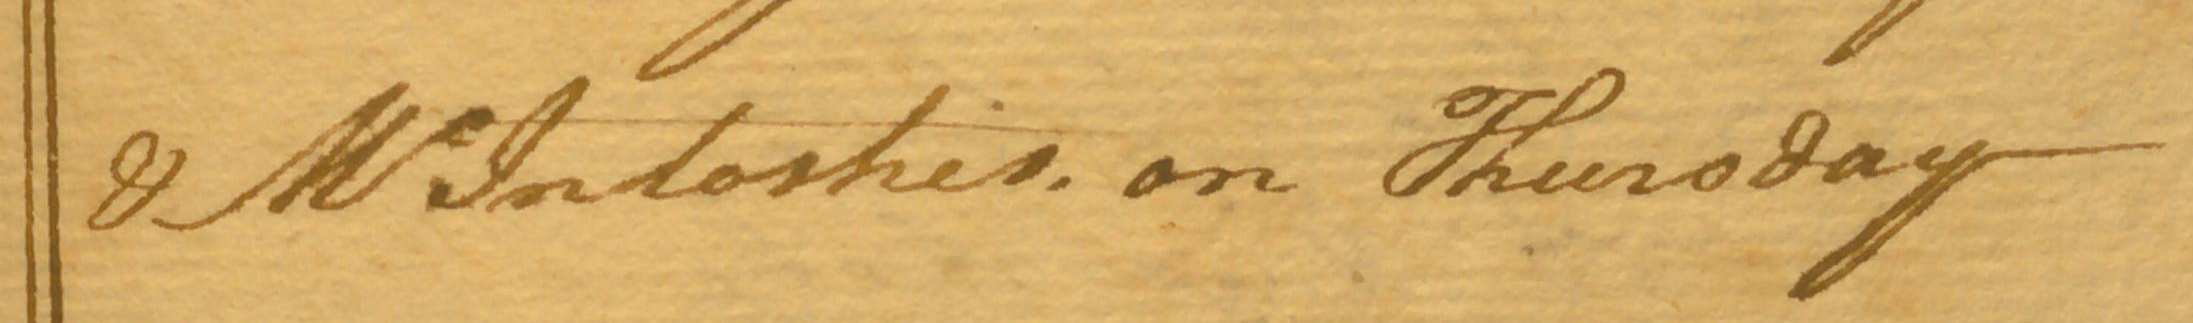& M^cIntoshes on Thursday
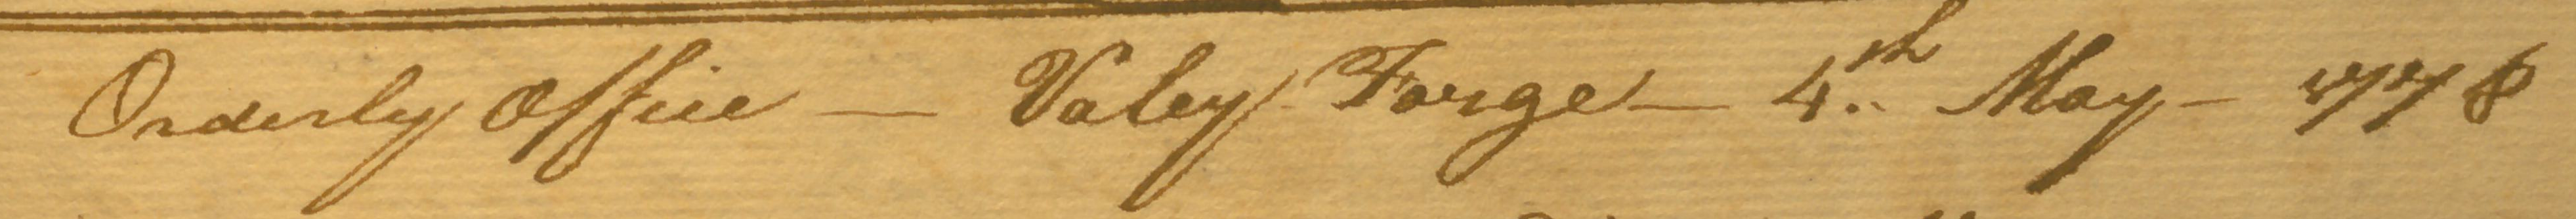Orderly Office- Valey Forge- 4^th. May- 1778
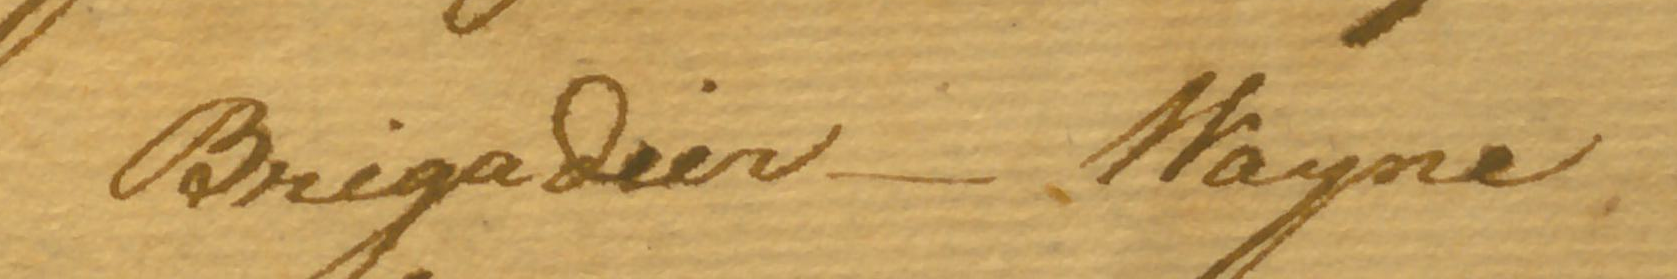Brigadier- Wayne
